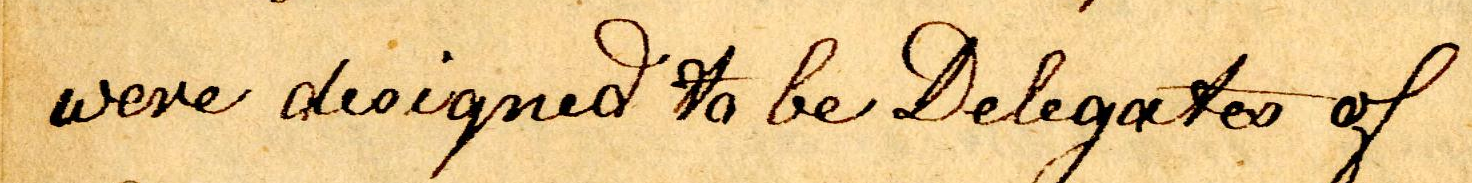were designed to be Delegates of
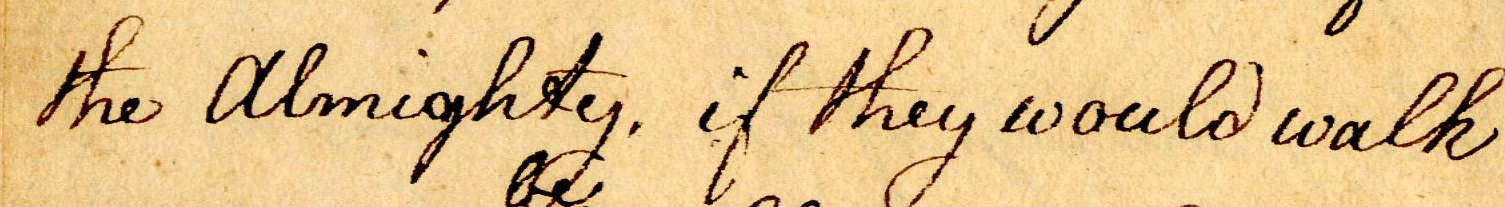the Almighty. if they would walk
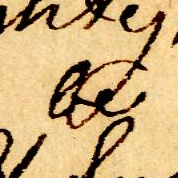be
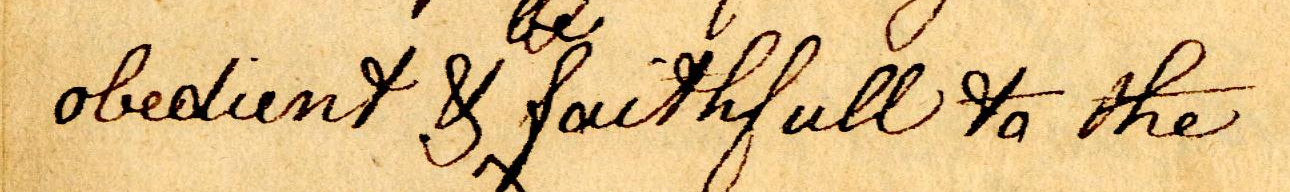obedient & ^ faithfull to the
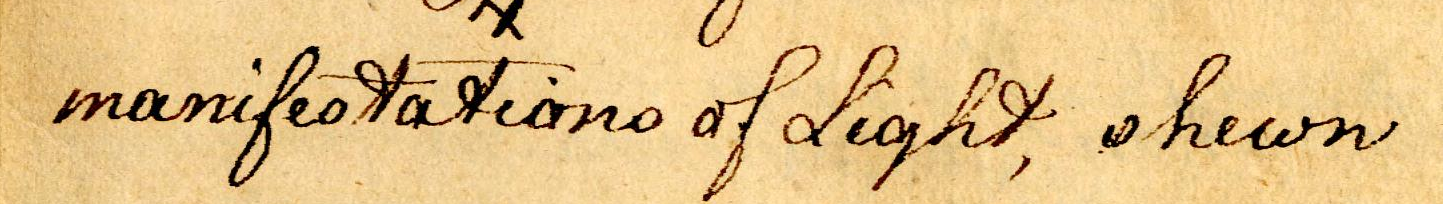manifestations of Light, shewn
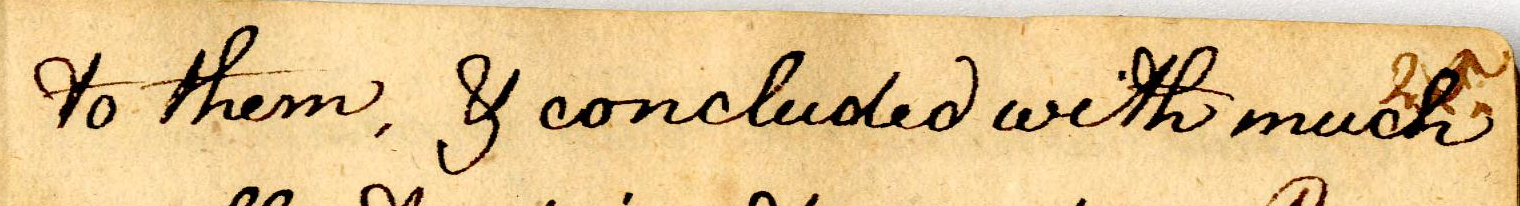to them, & concluded with much
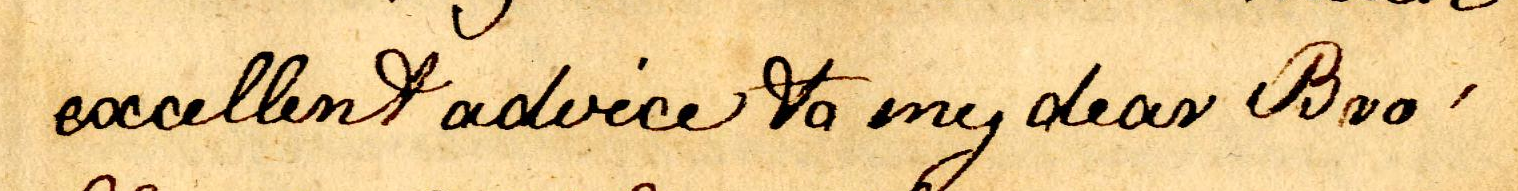excellent advice to my dear Bro'
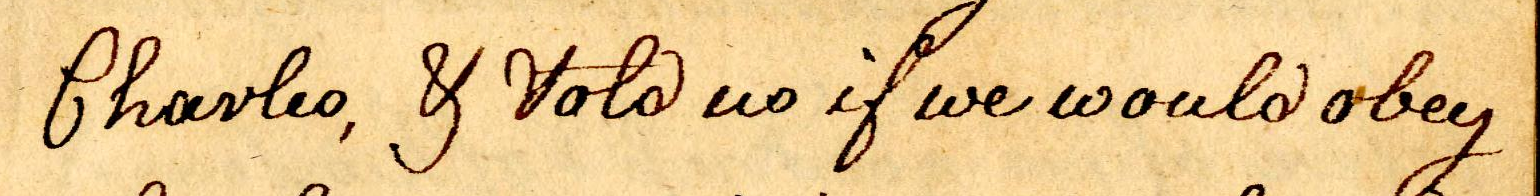Charles, & told us it we would obey
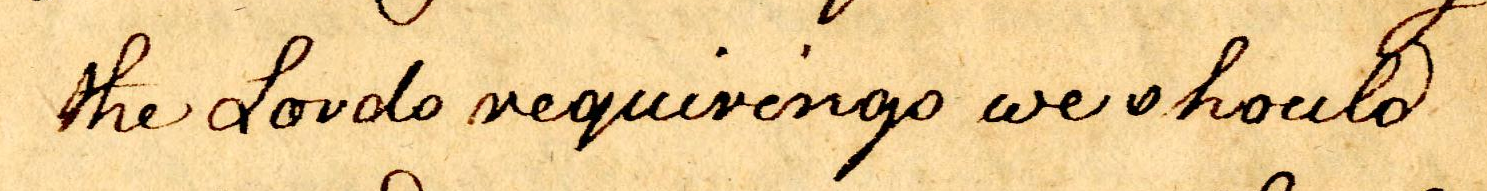the Lords requirings we should
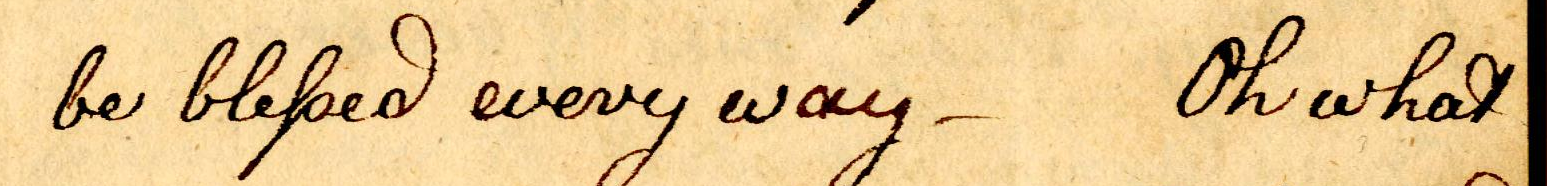be blessed every way- Oh what
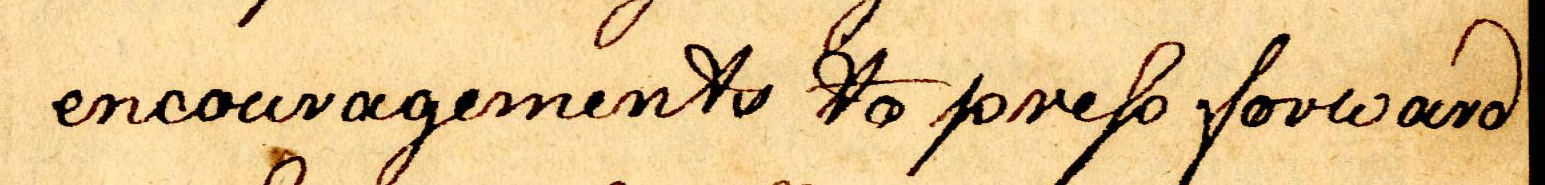encouragements to press forward
